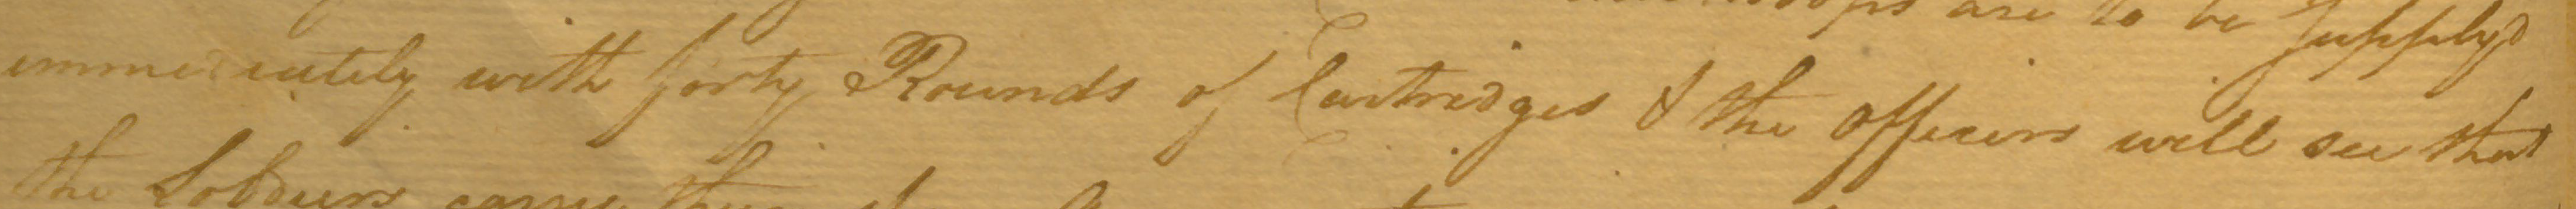immediately with forty Rounds of Cartridges & the officers will see that
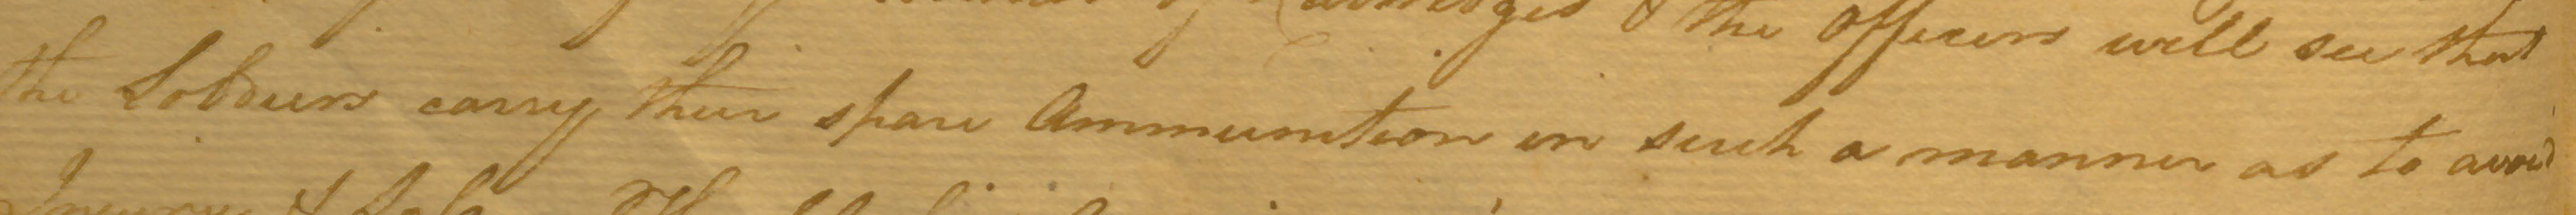the Soldiers carry their spare Ammunition in such a manner as to avoid
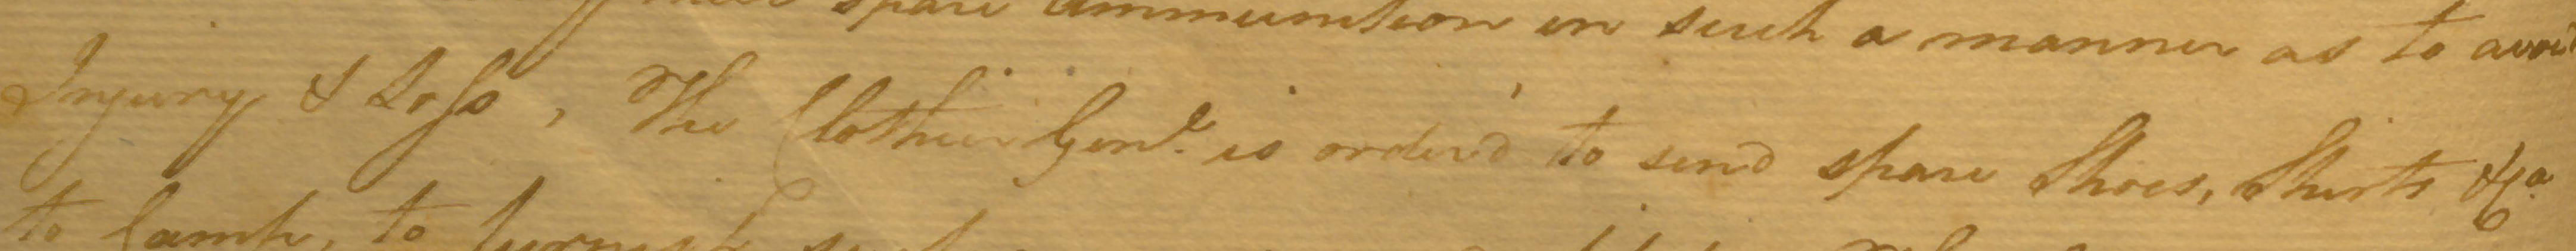Injury & Loss. The Clothier Gen^l. is order'd to send spare Shoes, Shirts &c^a.
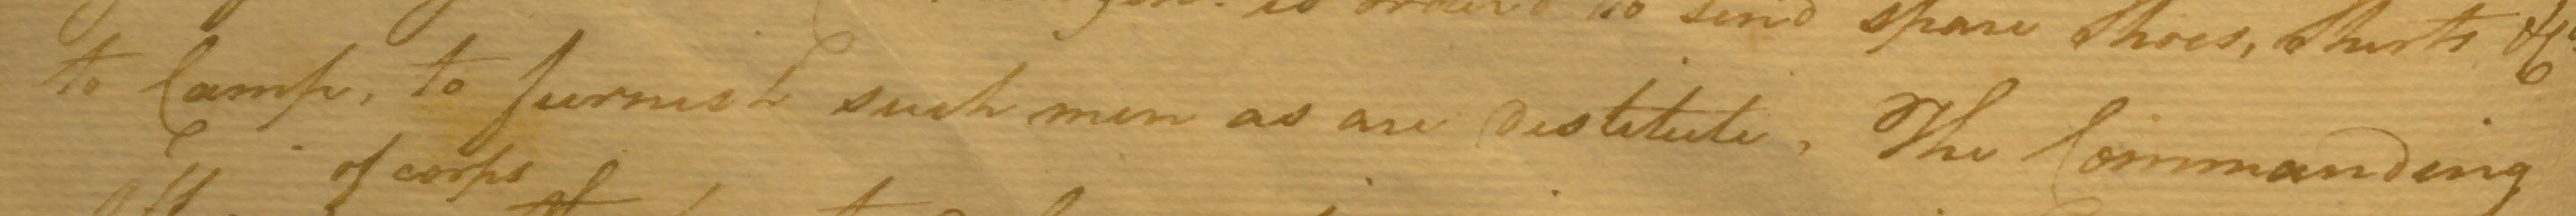to Camp, to furnish such men as are destitute. The Commanding
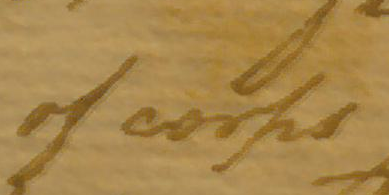of corps
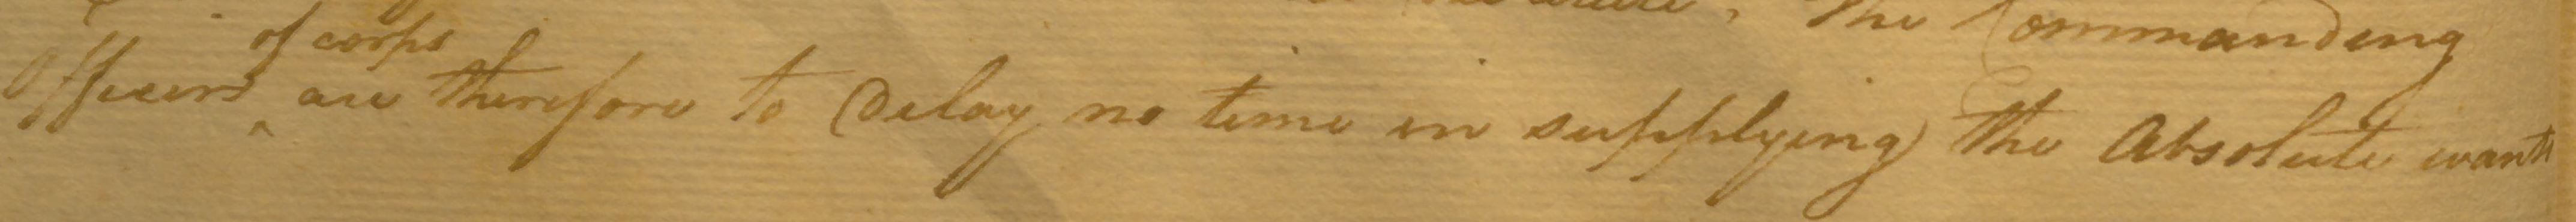Officers ^ are therefore to delay no time in supplying the Absolute wants
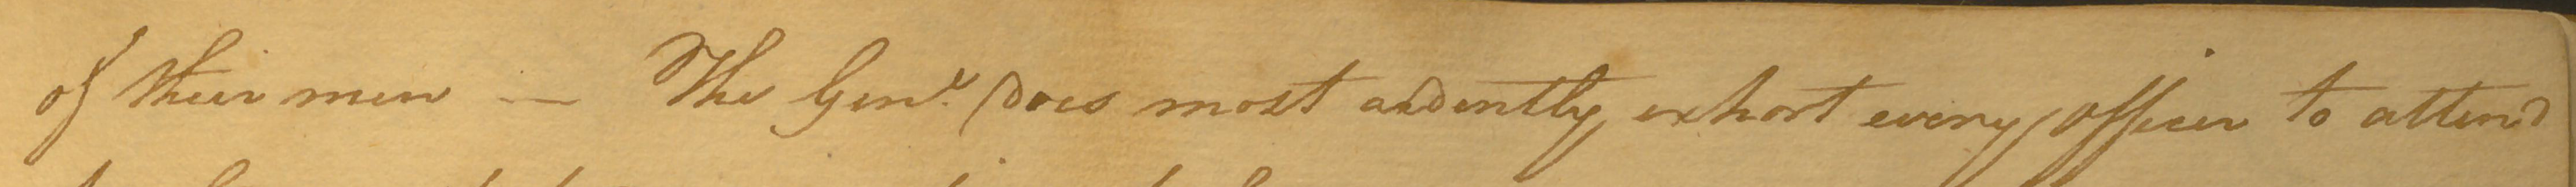of their men- The Gen^l. does most ardently exhort every officer to attend
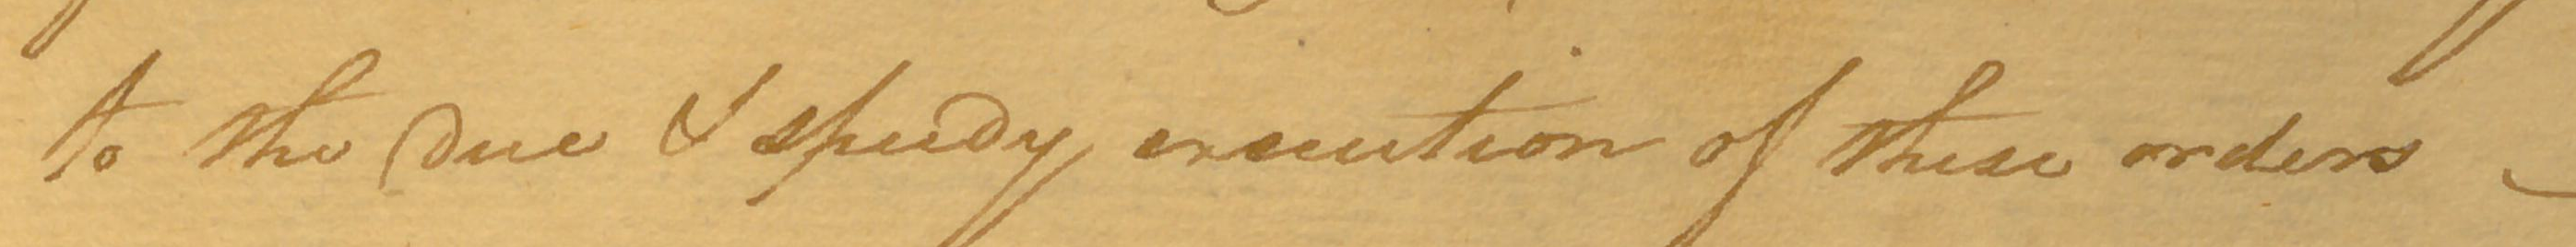to the due & speedy execution of these orders-
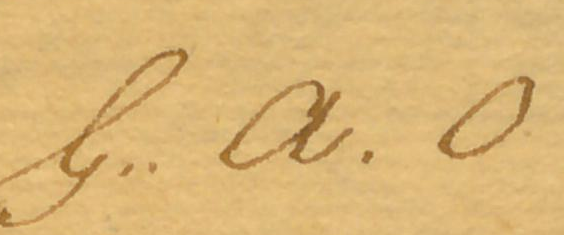G.A.O
